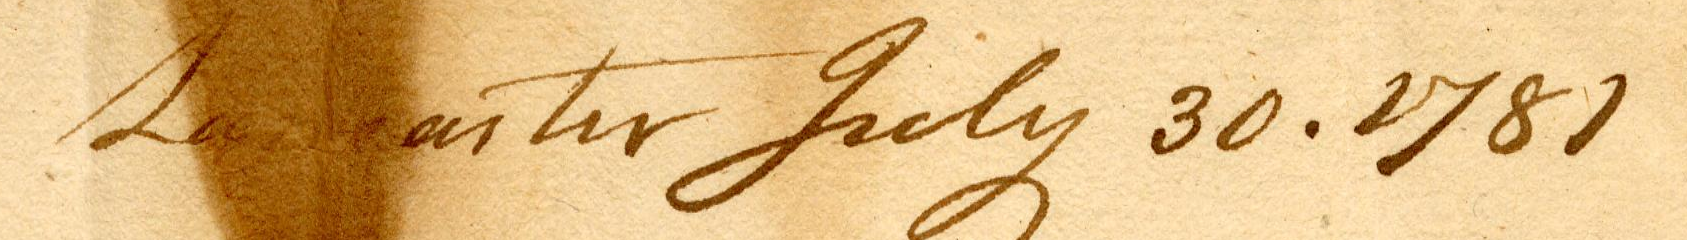Lancaster July 30. 1781
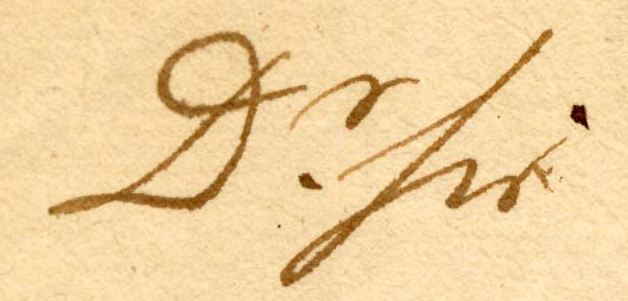D^r. Sir
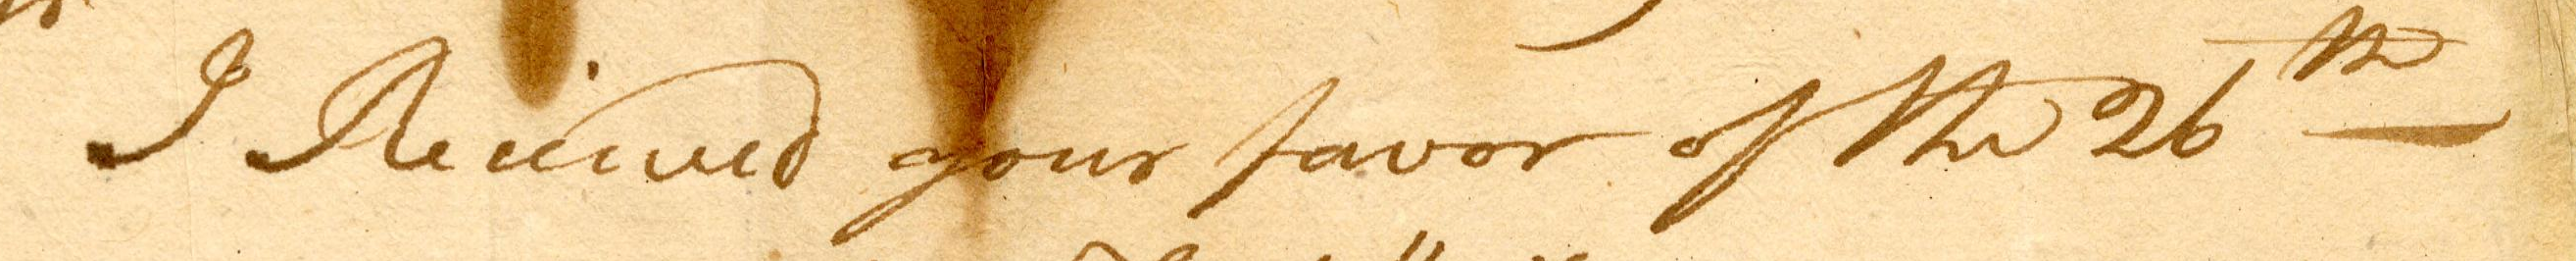I Recived your favor of the 26^th
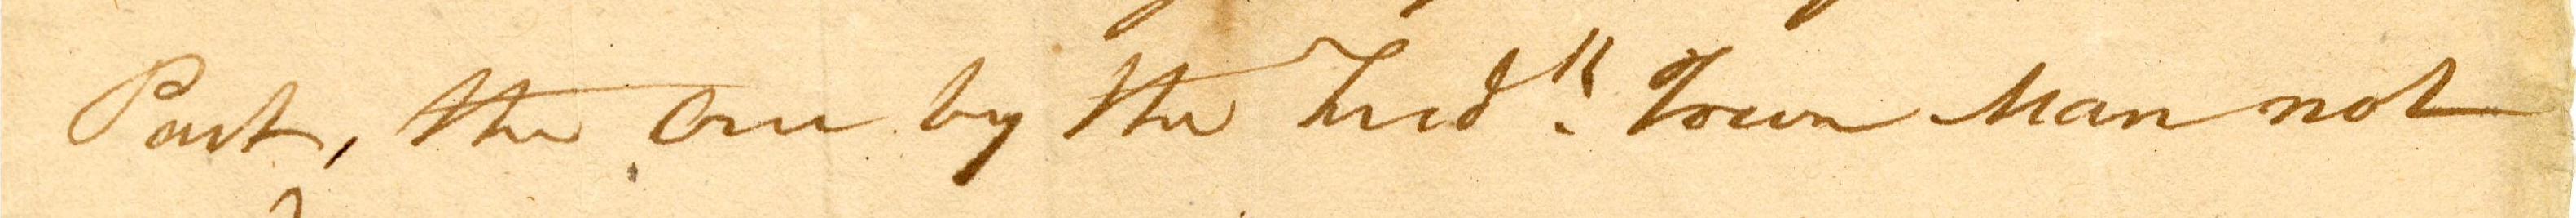Part, the one by the herd^le town man not
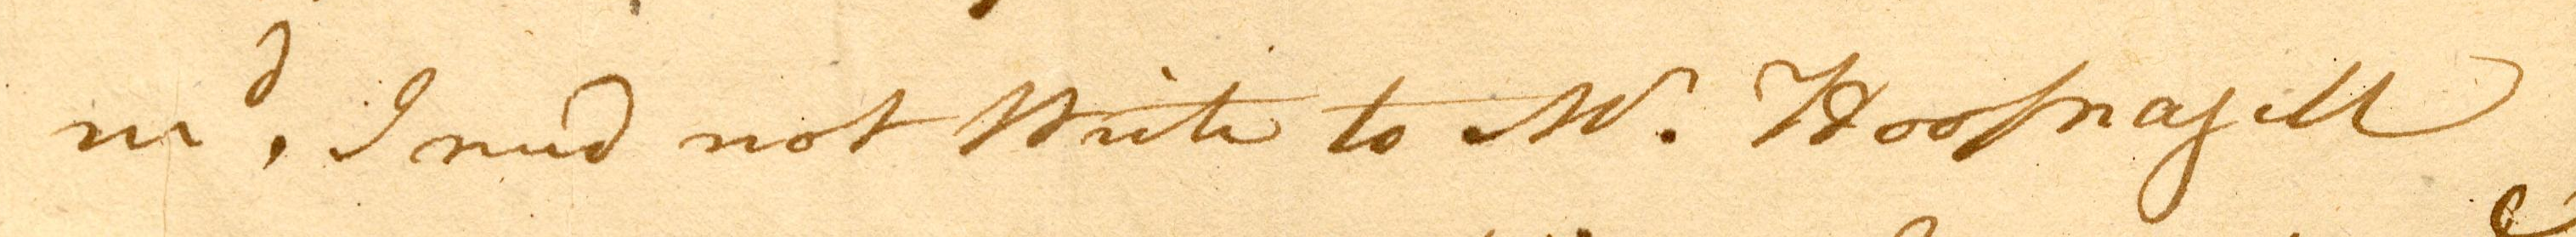in^d, I need not Write to M^r. Hoofnagill
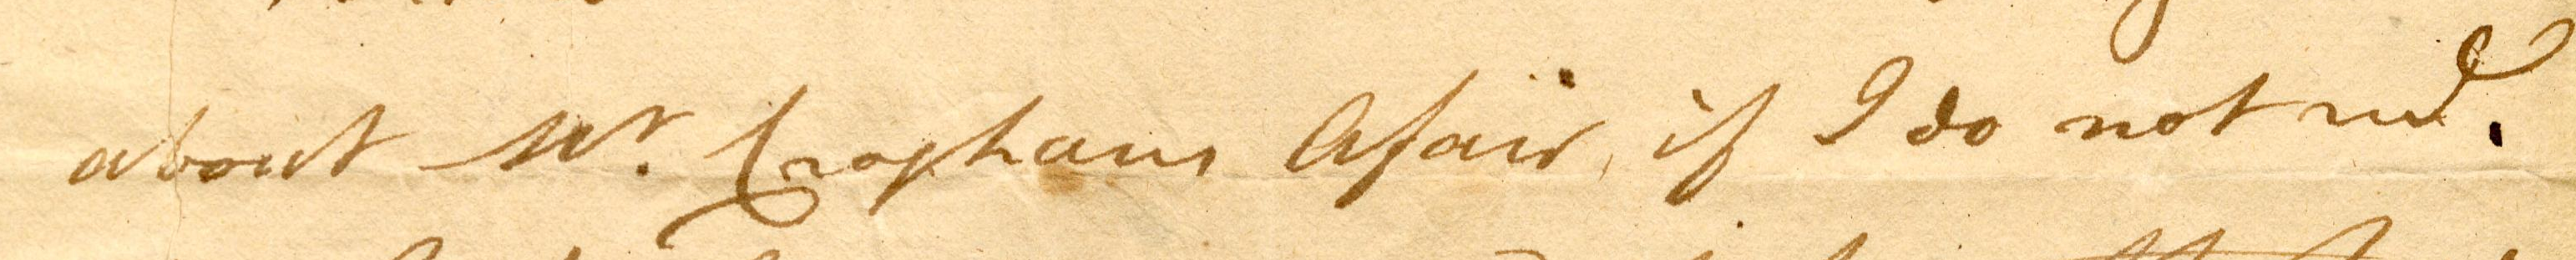about M^r. Croghans Afair if I do not rec^e
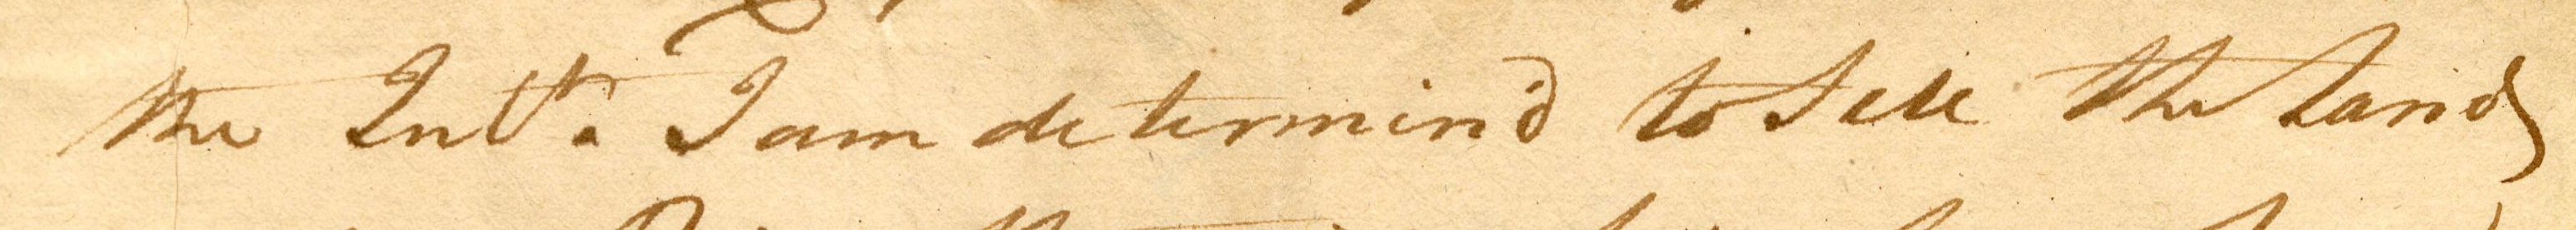the Int^t. I am determin'd to sell the land
